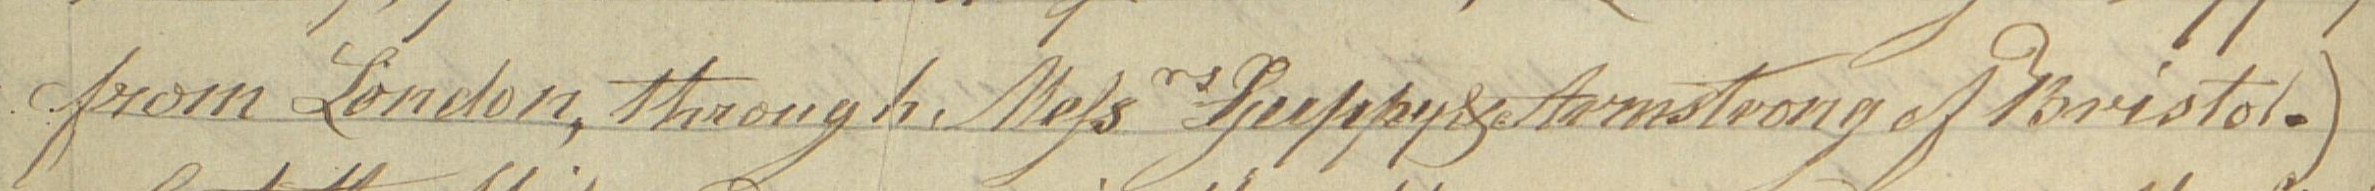from London, through Mess^rs Guppy & Armstrong of Bristol.)
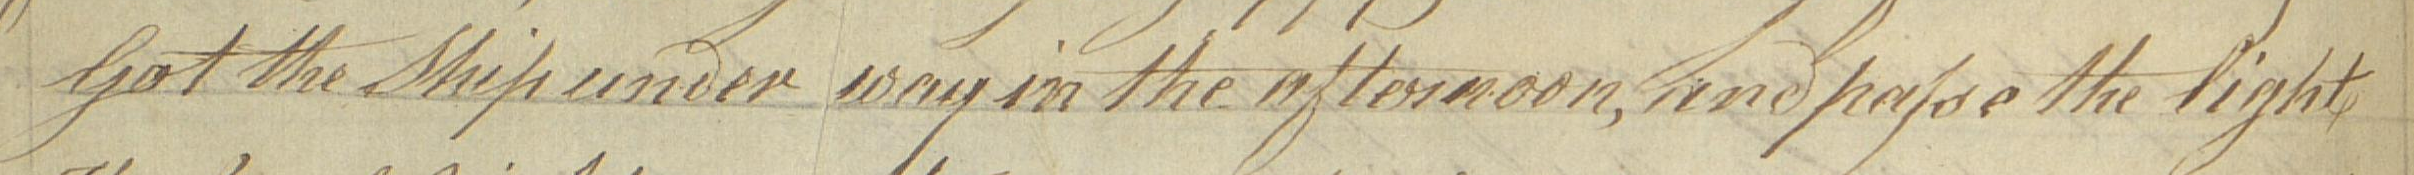Got the Ship under way in the afternoon, and passe the light
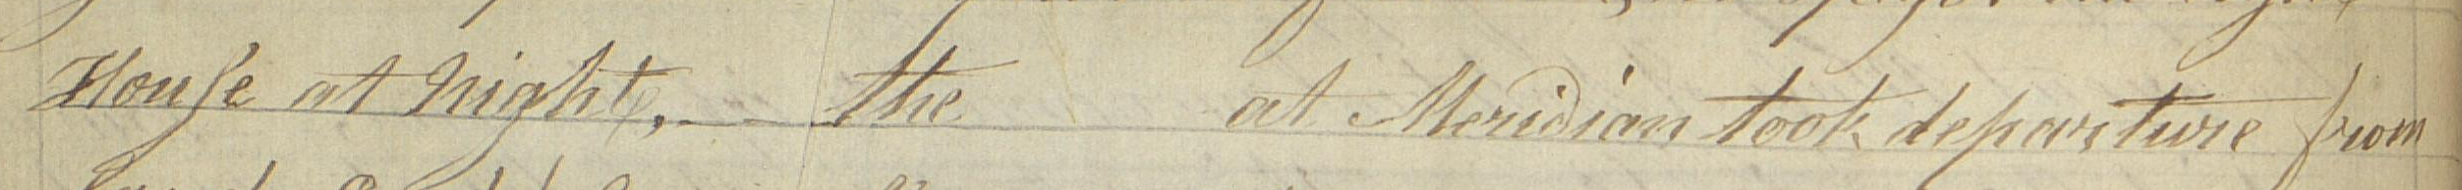House at night. the at Meridian took departur from
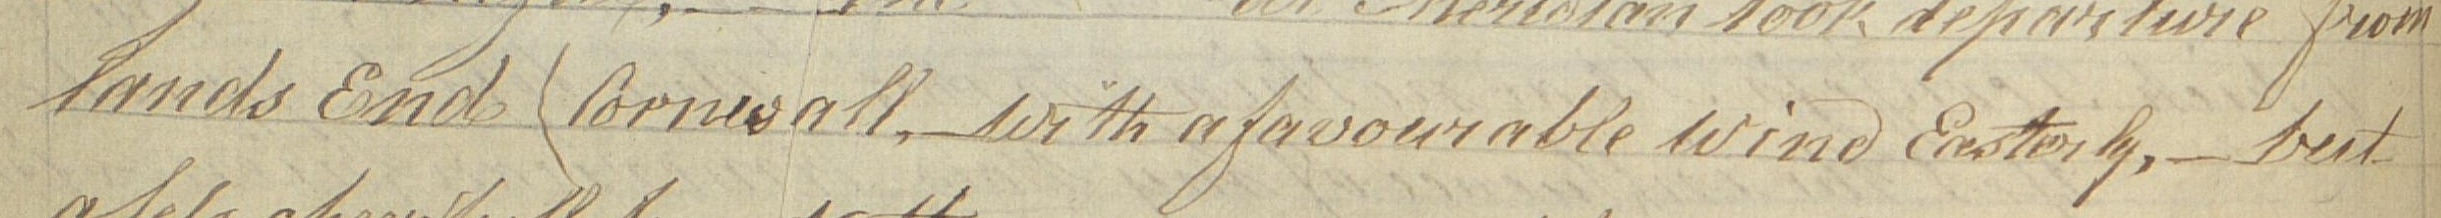lands End (Cornwall, with a favourable wind Easterly, but
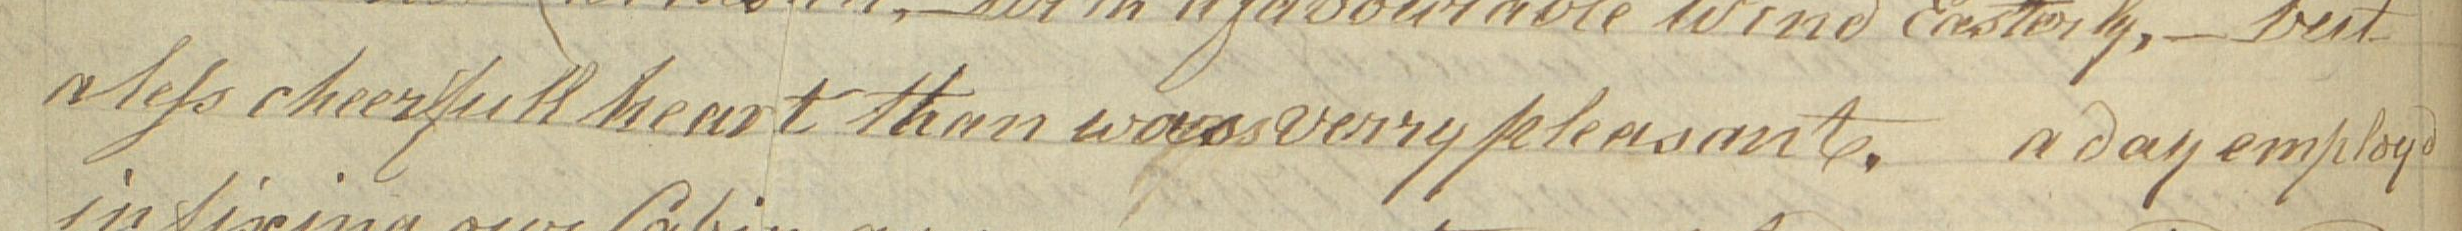a less cheerfull heart than was verry pleasant. a day employd
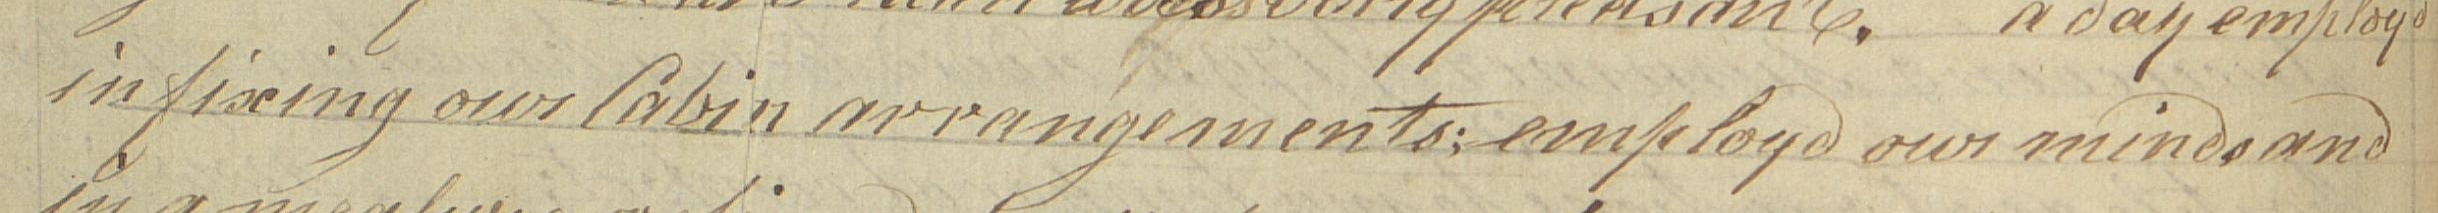in fixing our Cabin arrangements; employd our minds and
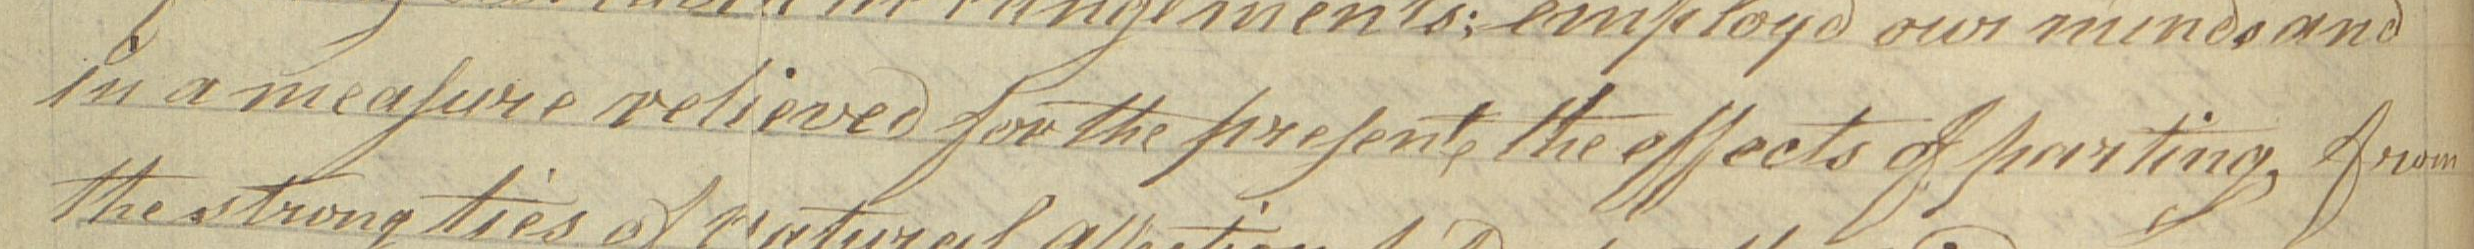in a measure relieved for the present, the effects of parting, from
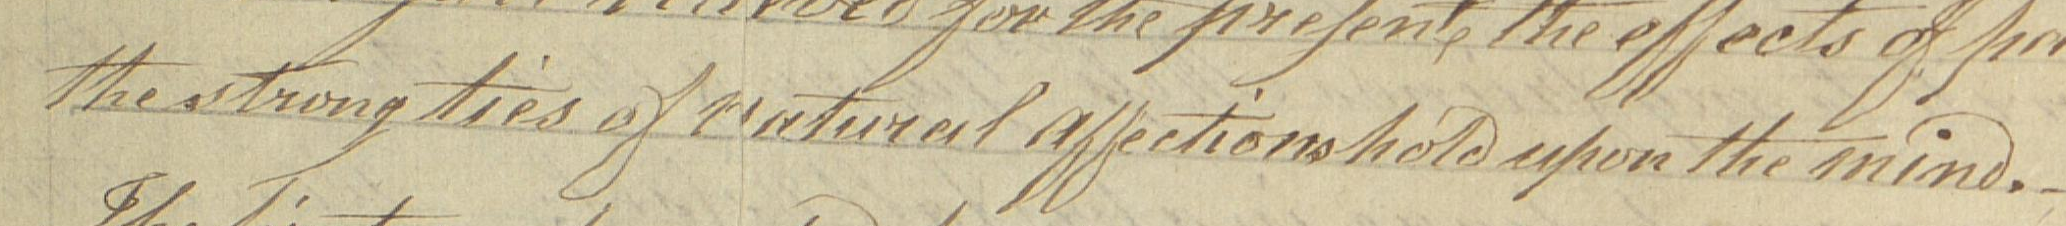the strong ties of natural affections hold upon the mind.
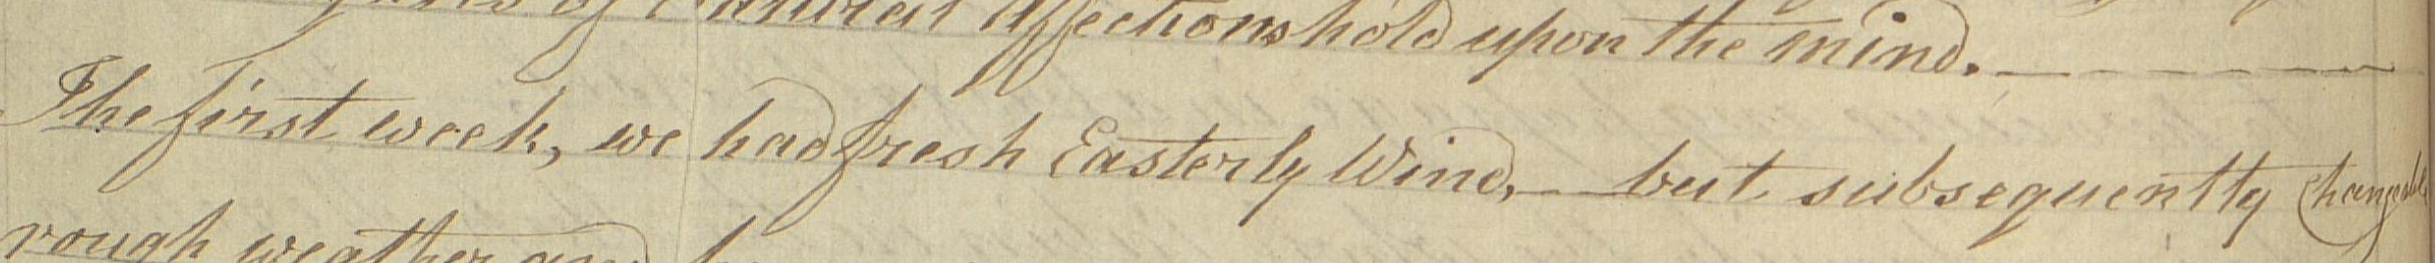The first week, we had fresh Easterly Wind, but subsequently Changeable
